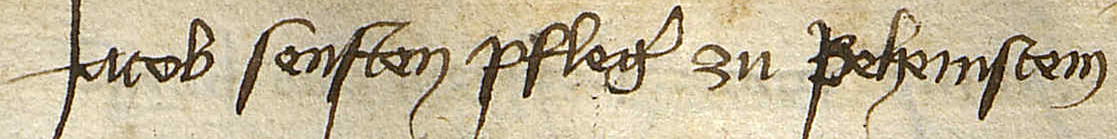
Iacob ſenften pfleg* ʒu Behemſtein
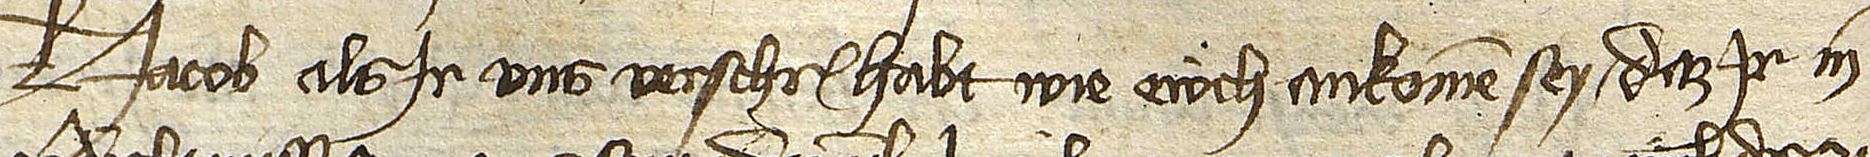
L* Iacob als Ir vns verſchr* habt wie eẅch ankome* ſey / Daʒ Ir in
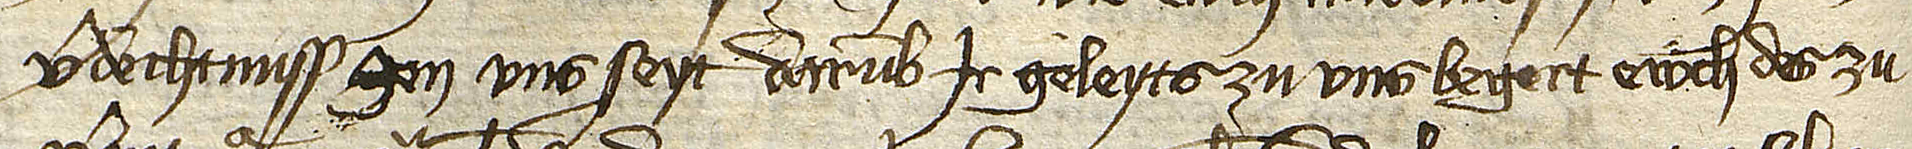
v*dechtnuſſ gen vns ſeyt darub* Ir geleyts ʒu vns begert eẅch des ʒu
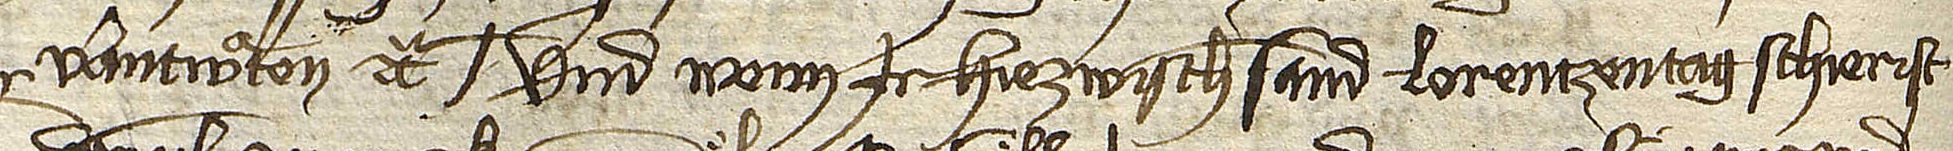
v*antw*ten ec* / Vnd wenn Ir hieʒwiſch* ſand Lorencʒentag ſchieriſt
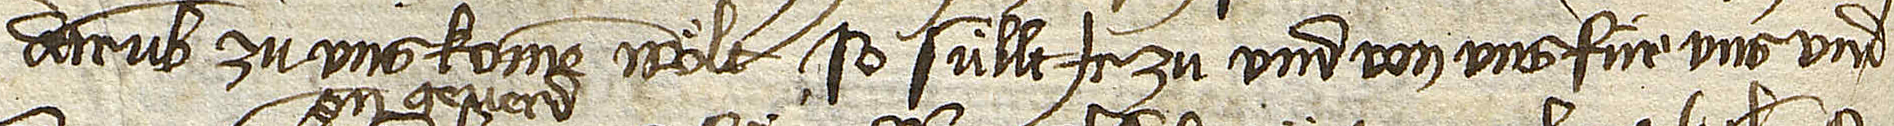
darub* ʒu vns kome* wölt / ſo ſüllt Ir ʒu vns von vns für vns vnd
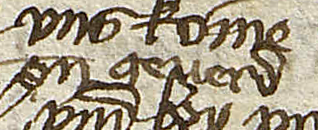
on geuerd
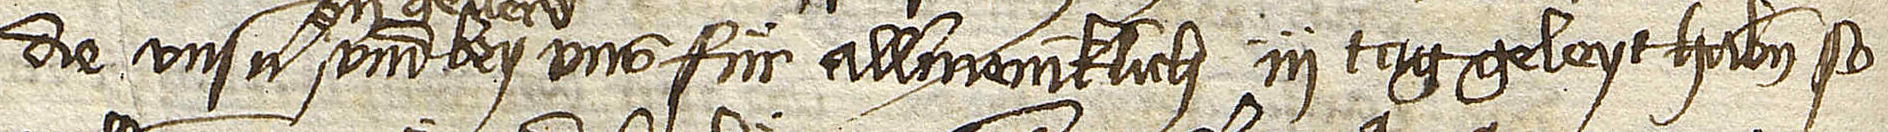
die vnſn* vnd bey vns für all*meniklich iii tag geleyt habn* ſo
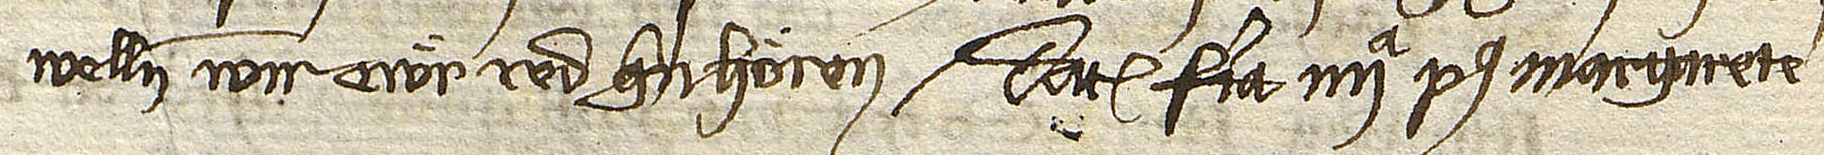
welln* wir eẅr red g*n hören / Dat* fi*a iiii* p* margarete
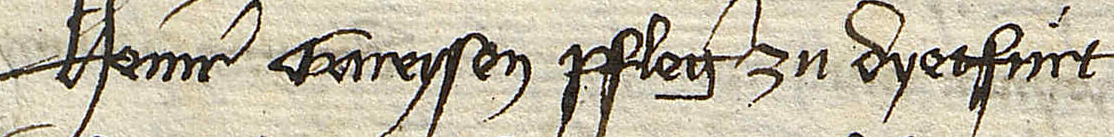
Heinr* Gareyſen pfleg* ʒu dyetfürt
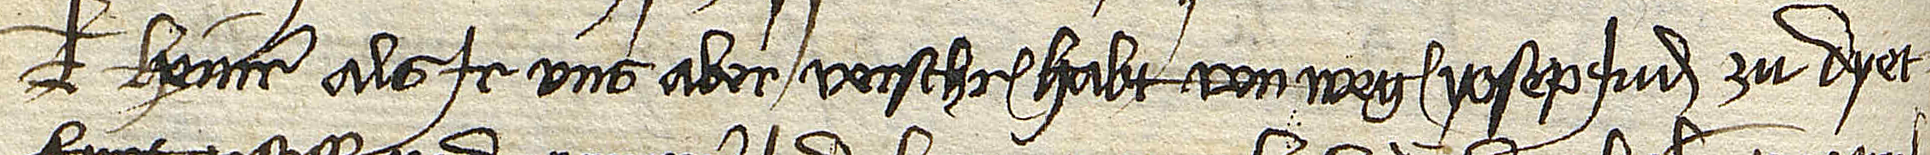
L* Heinr* als Ir vns aber verſchr* habt von weg* yoſep Iud ʒu Dyet =
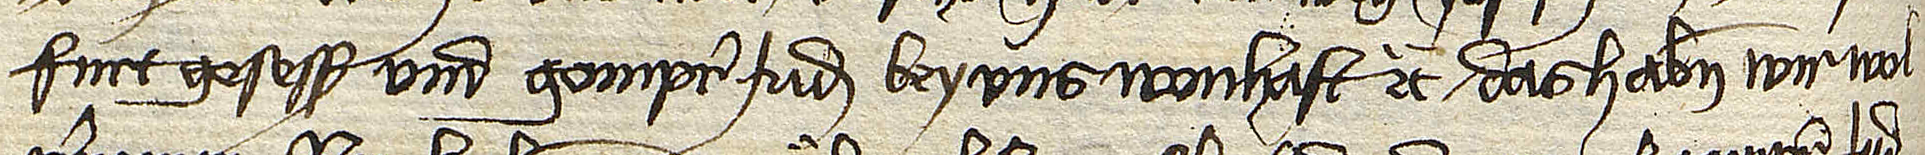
furt geſeſſ* vnd gompr* Iud bey vns wonhaft ec* / das habn* wir wol
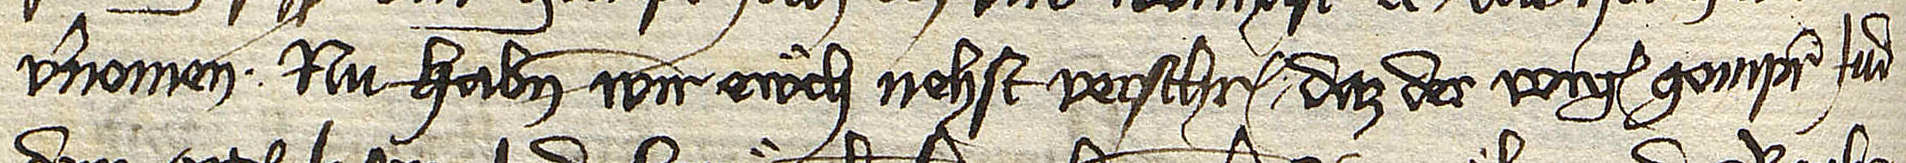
v*nomen . Nu habn* wir eẅch nehſt verſchr* / daʒ der vorg* gompr* Iud
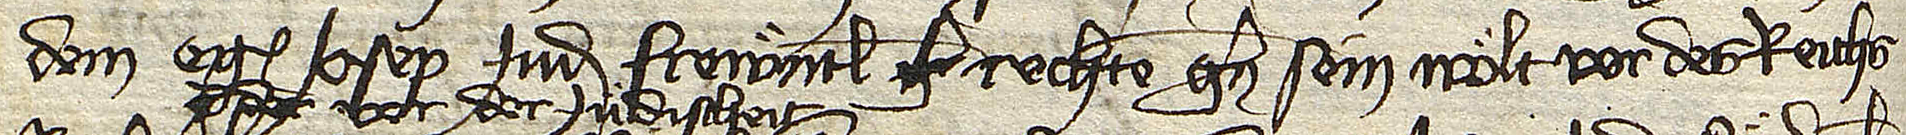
dem eg* Ioſep Iud* freẅntl* g rechte* g*n ſein wölt vor des Reichs
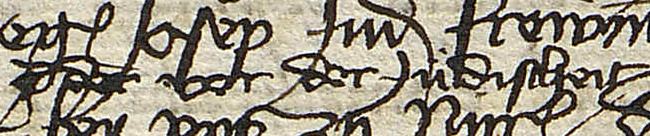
oder vor der Iüdiſcheit
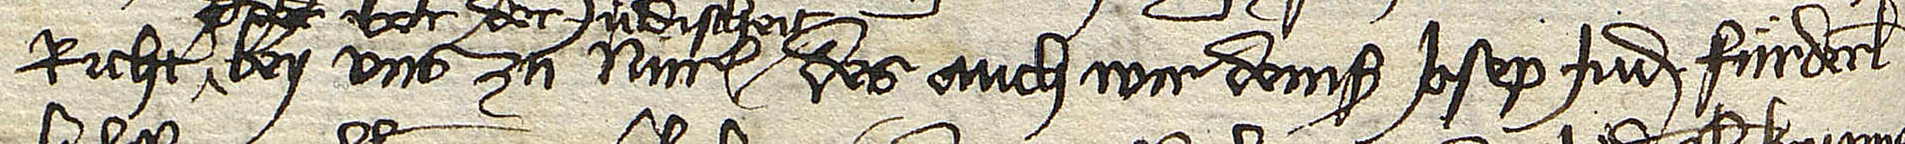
Richt* bey vns ʒu Nür* / Des auch wir demſ* Ioſep Iud* fürderl*
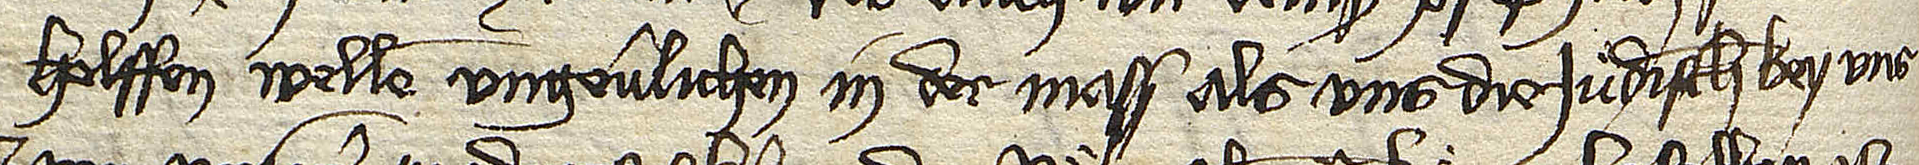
helffen welle* vngeu*lichen in der maſſ als vns die Iüdiſch* bey vns
